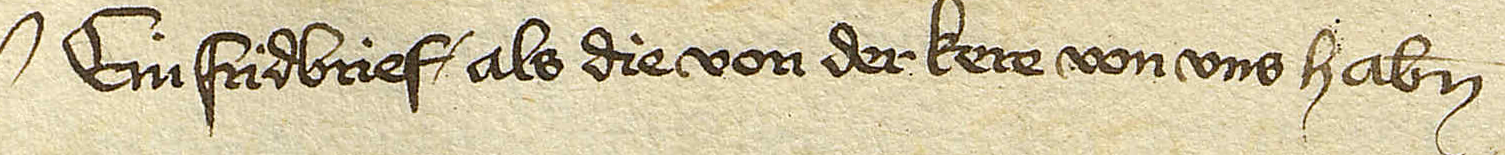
Ein fridbrief / als die von der kere von vns habn*
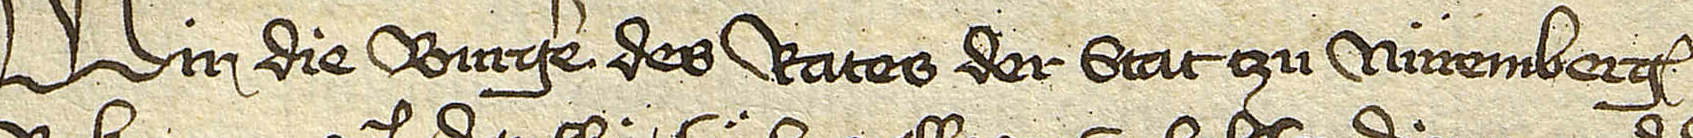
Wir die Burge* des Rates der Stat cʒu Nüremberg*
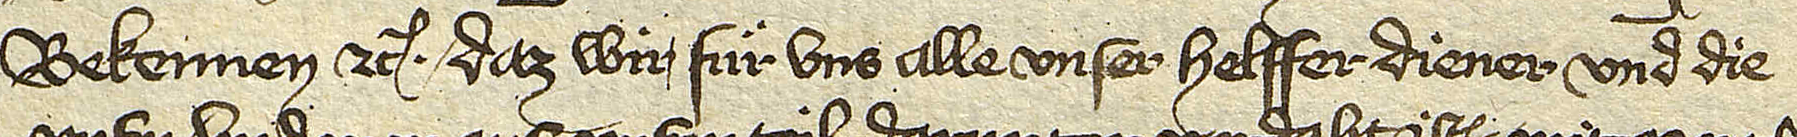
Bekernnen ec* . / daʒ wir für vns alle vnſer helffer diener vnd die
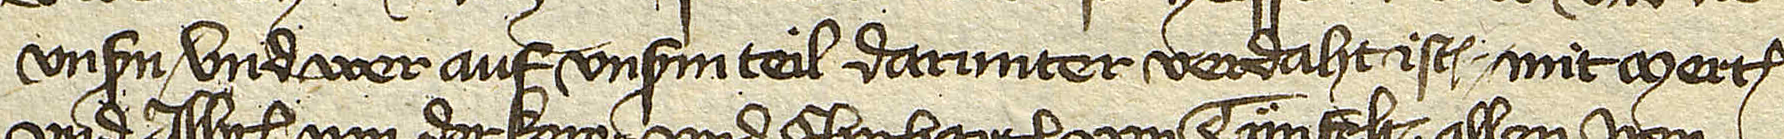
vnſ*n / vnd wer auf vnſ*m teil darunter verdaht iſt / mit Mert*
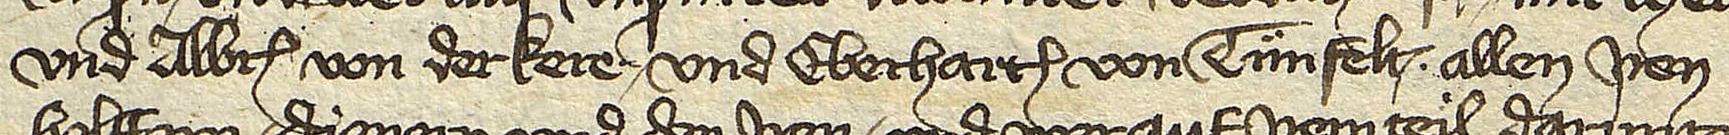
vnd Albr* von der kere / vnd Eberhart* von Tünfelt / . allen Iren
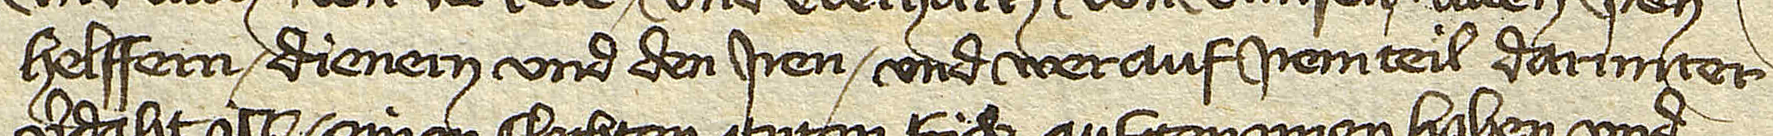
helffern / dienern vnd den Iren / vnd wer auf Irem teil darunter
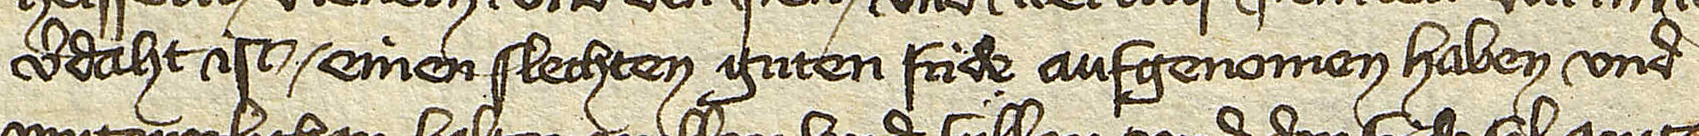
v*daht iſt / einen ſlechten guten fride aufgenomen haben vnd
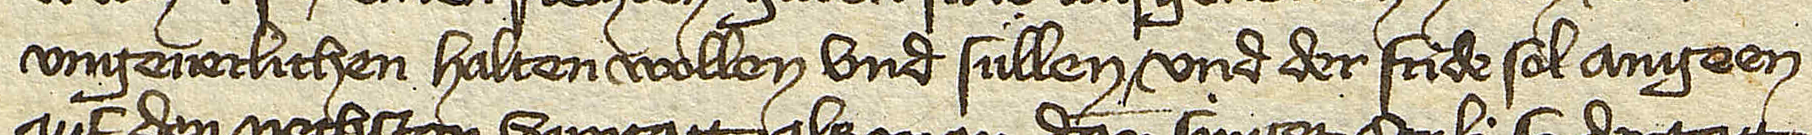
vngeuerlichen halten wollen vnd ſüllen / vnd der fride ſol angeen
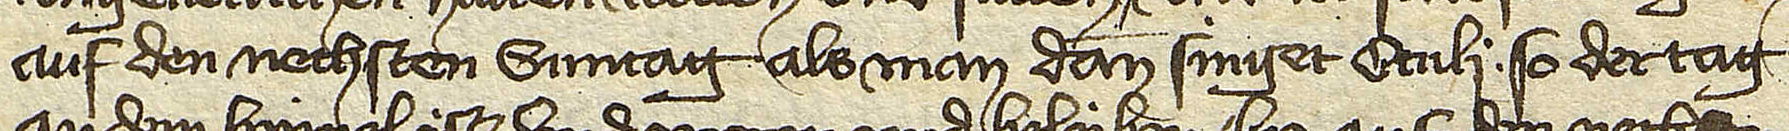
auf den nechſten Suntag als man dan* ſinget Oculi . ſo der tag
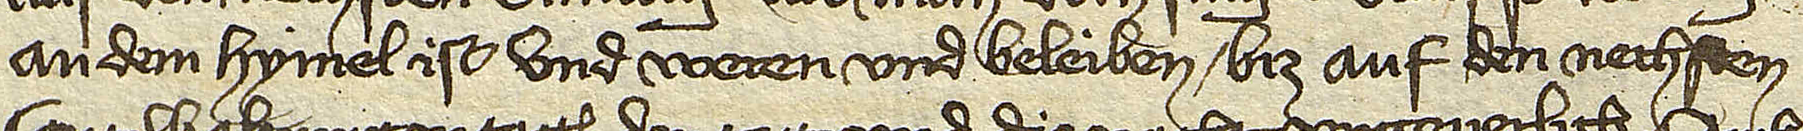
an dem hymel iſt vnd weren vnd beleiben / biʒ auf den nechſten
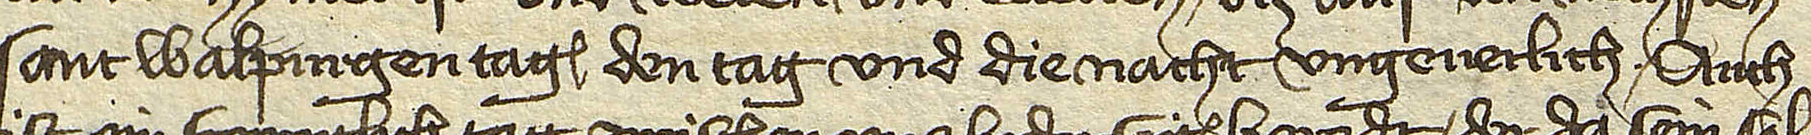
ſant walpurgen tag* den tag vnd die nacht vngeuerlich . / Auch
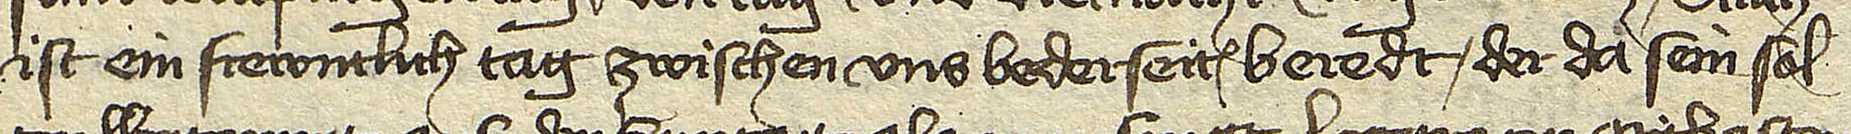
iſt ein frewntlich tag cʒwiſchen vns bederſeit* beredt / der da ſein ſol
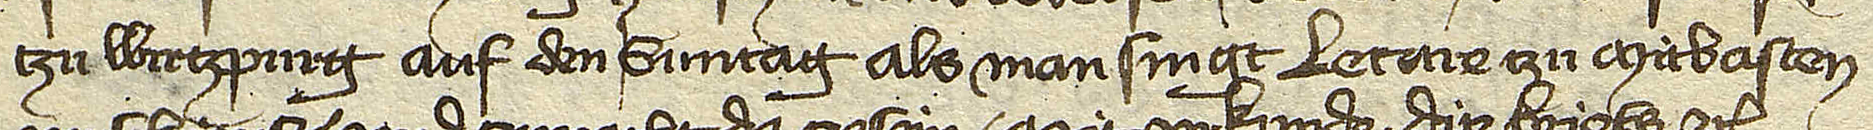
cʒu wircʒpurg auf den Suntag als man ſingt Letare cʒu Mitvaſten
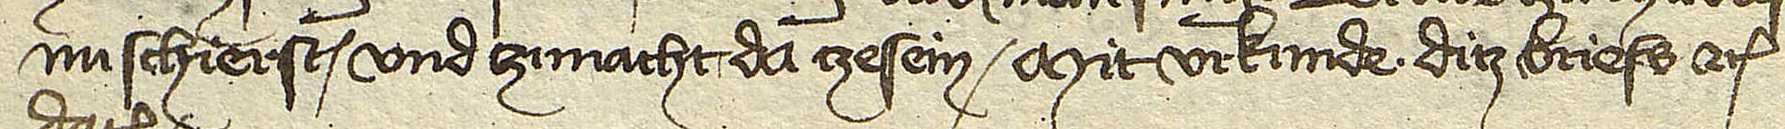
nu ſchierſt / vnd cʒunacht da cʒeſein / Mit vrkunde dicʒ briefs ec*
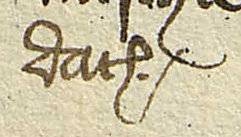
dat* . /
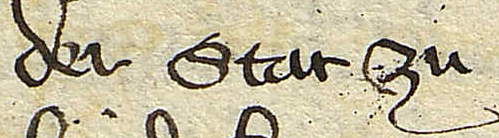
der Stat cʒu
